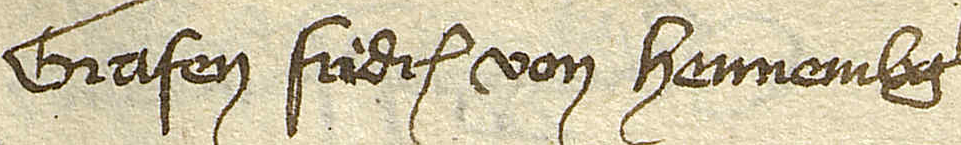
Grafen fridr* von hennembg*
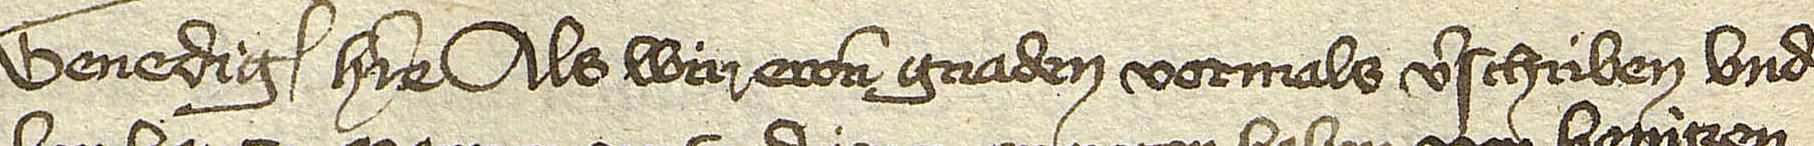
Gnedig* hr*e Als wir ewn* gnaden vormals v*ſchriben vnd
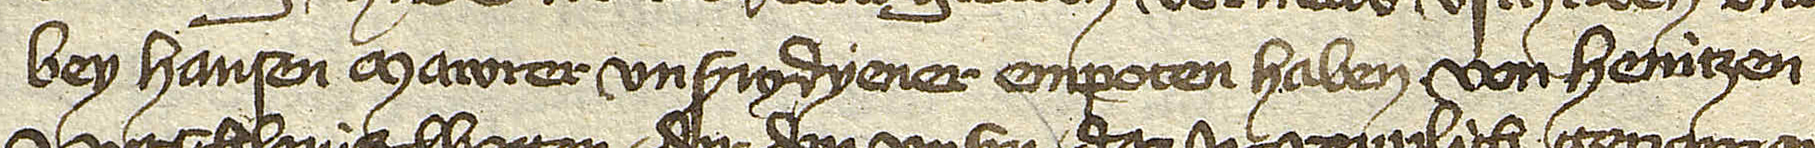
bey hanſen Mawrer vnſ*m dyener empoten haben von heincʒen
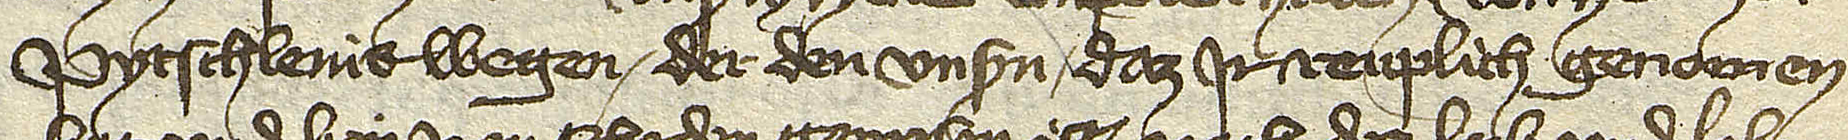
Pytſchleins wegen / der den vnſ*n / daʒ Ir reuplich genomen
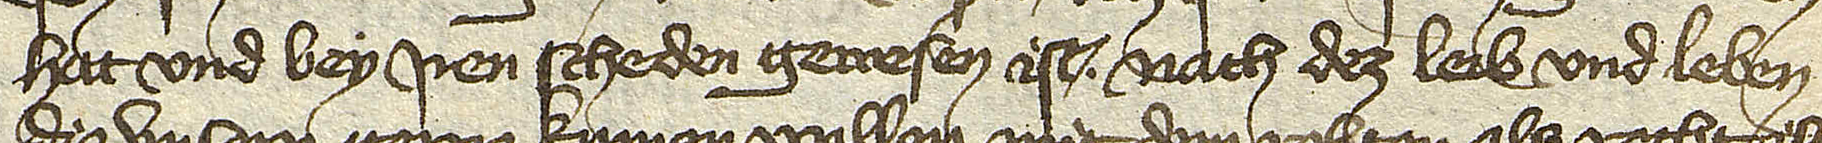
hat vnd bey Iren ſcheden geweſen iſt / . nach deʒ leib vnd leben
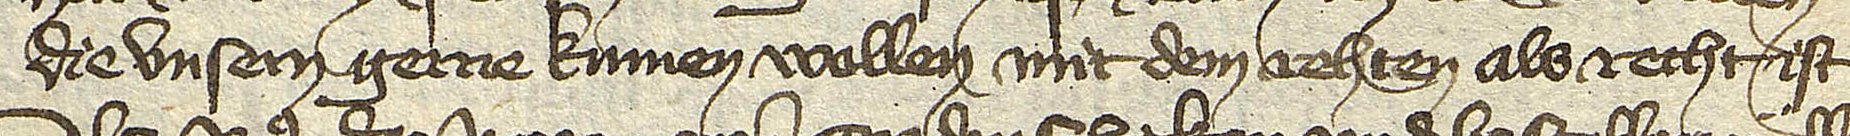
die vnſern gerne kumen wollen mit dem rechten als recht iſt
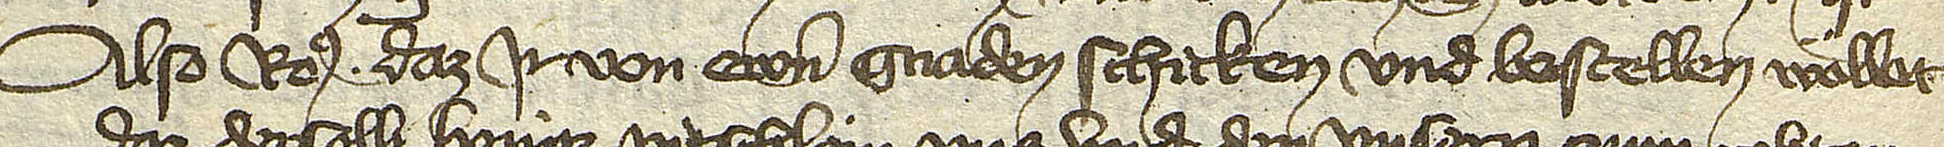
Alſo Ro* . daʒ Ir von ewn* gnaden ſchicken vnd beſtellen wöllet
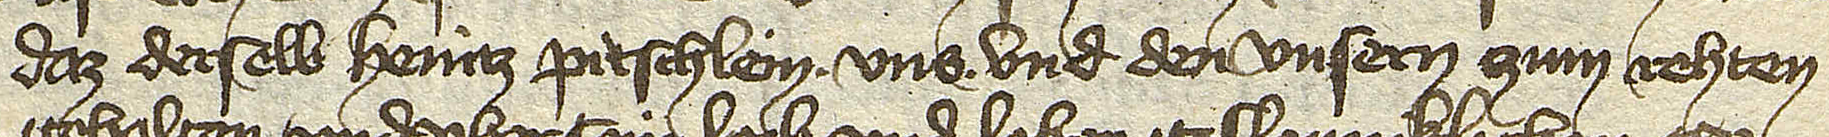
daʒ derſelb heincʒ pitſchlein . vns . vnd den vnſern cʒum rehten
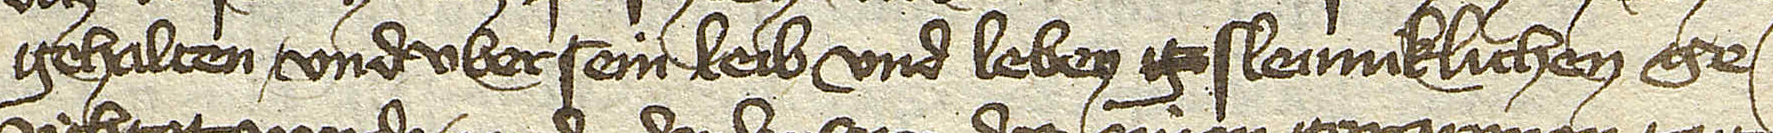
gehalten / vnd vber ſein leib vnd leben g ſleuniklichen ge
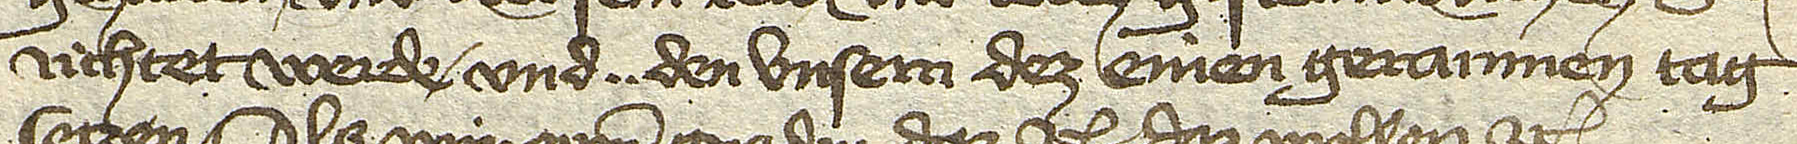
richtet werde / vnd ~ den vnſern deʒ einen geraumen tag
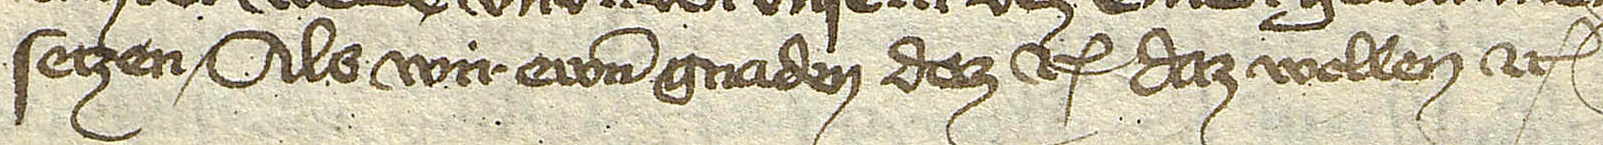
ſecʒen / Als wir ewn* gnaden daʒ ec* daʒ wollen ec*
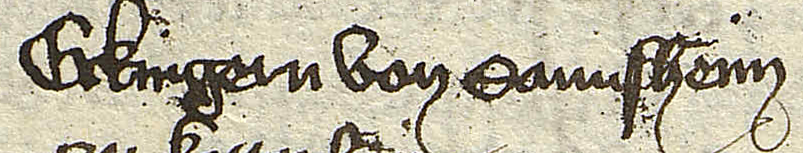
Erkingern von Saunſheim
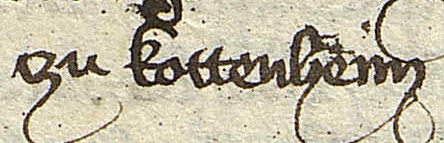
cʒu kottenheim
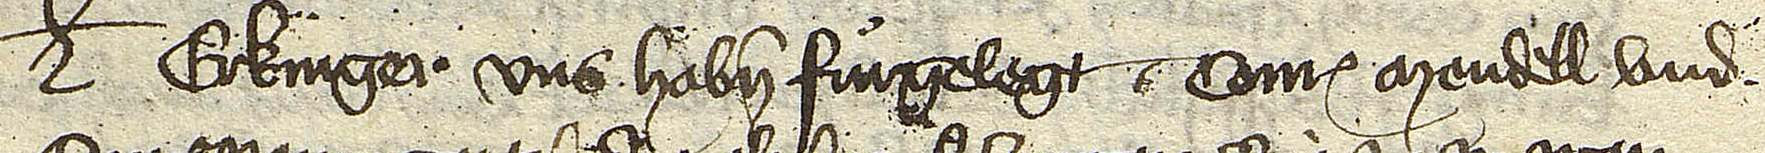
L* Erkinger vns habn* fürgelegt / Conr* Mendell vnd
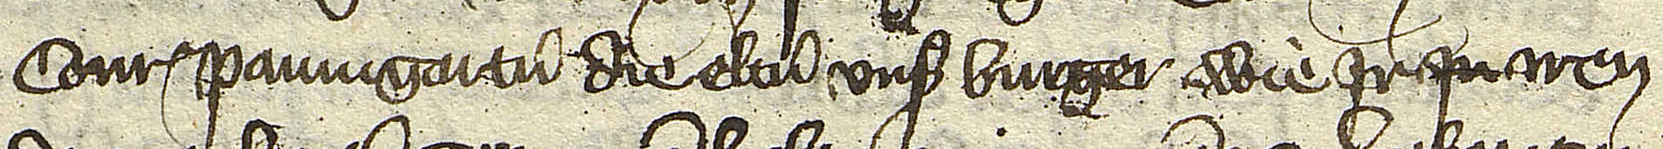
Conr* Paumgartn* die eltn* vnſ* burger / wie Ir In Iren
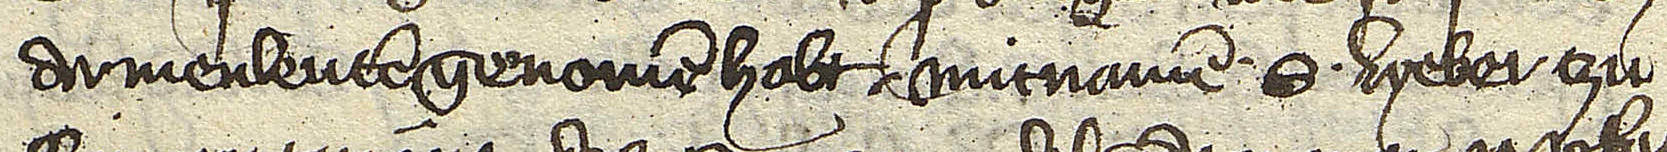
Armenleute* genome* habt / mitname* . S . Lyeber cʒu
